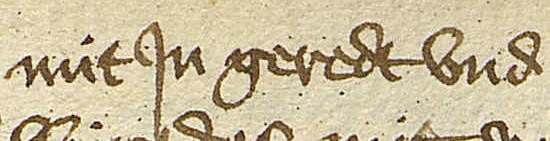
mit In geredt vnd
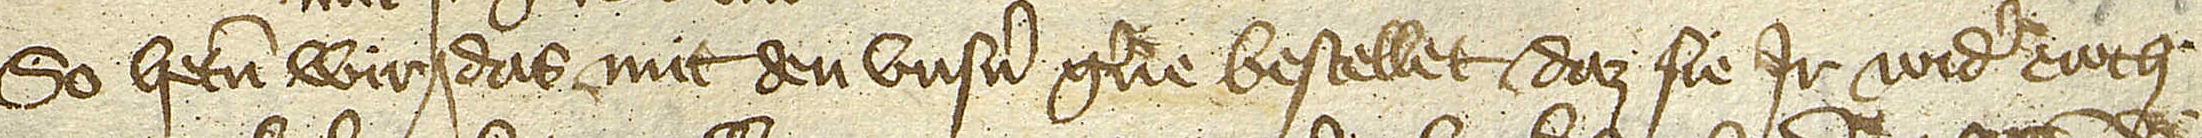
So hetn* wir das mit den vnſn* g*ne beſtellet / daʒ ſie Ir wid* ewch
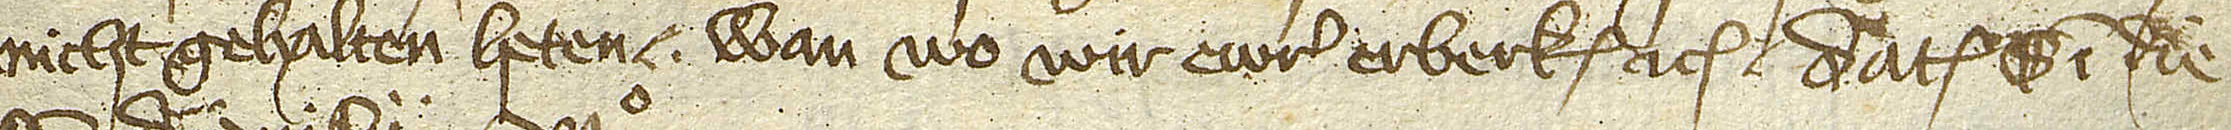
nicht gehalten heten / . wan wo wir ewr* erberk* ec* / Dat* S i* die
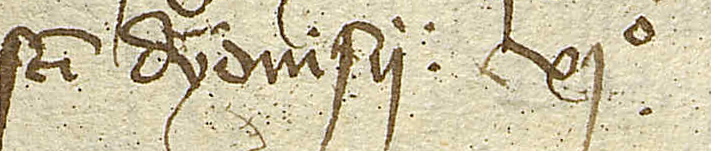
ſci* dyoniſii . xi* .
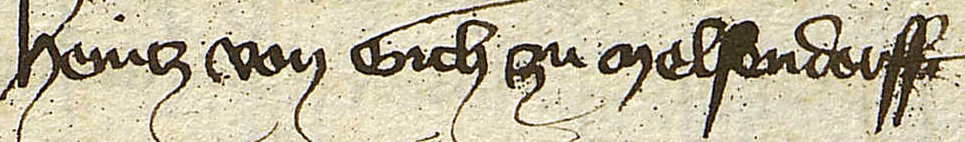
Heincʒ von Gich cʒu Melſendorff
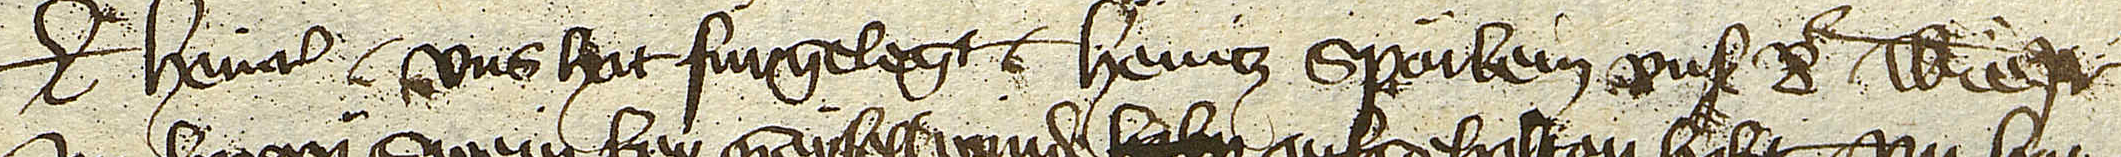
L* heinr* / vns hat fürgelegt / heincʒ Spörlein vnſ* B* / wie Ir
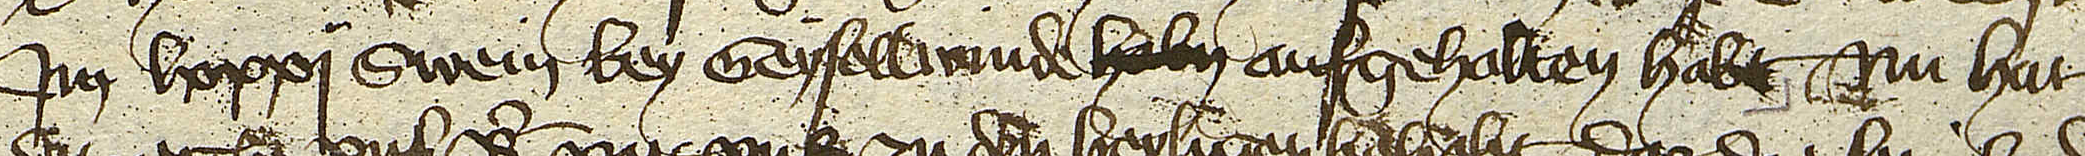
Im lxxxi Swein bey Geyſellwinde habn aufgehalten habt / Nu hat
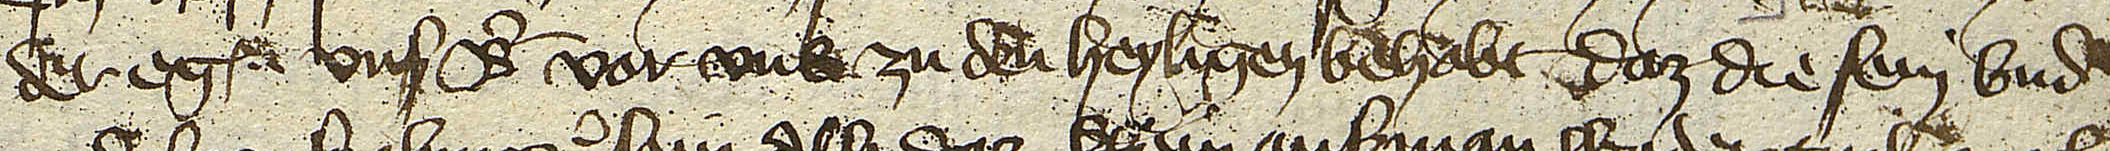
der eg* ~ vnſ* B* vor vns cʒu den heyligen behabt daʒ die ſein vnd
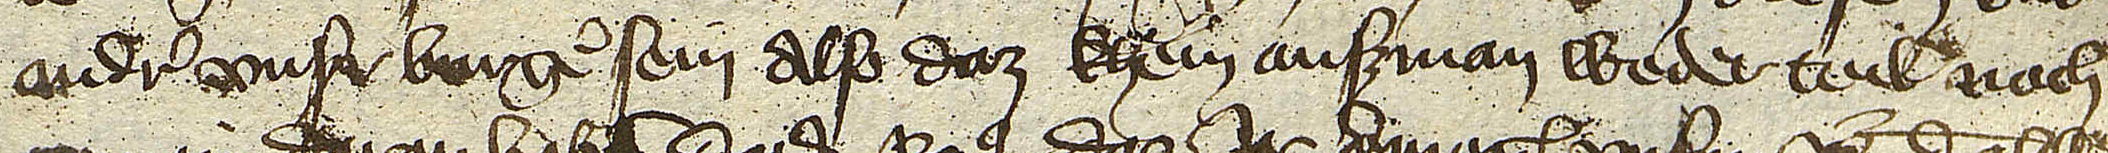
andr* vnſr* burge* ſein Alſo daʒ khein auſʒman weder teil noch
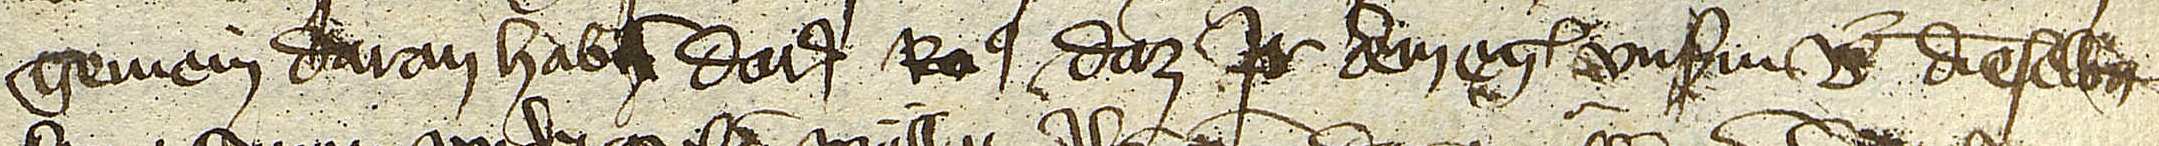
gemein daran habn* Dar* Ro* / daʒ Ir dem eg* vnſ*m B* dieſelbn*
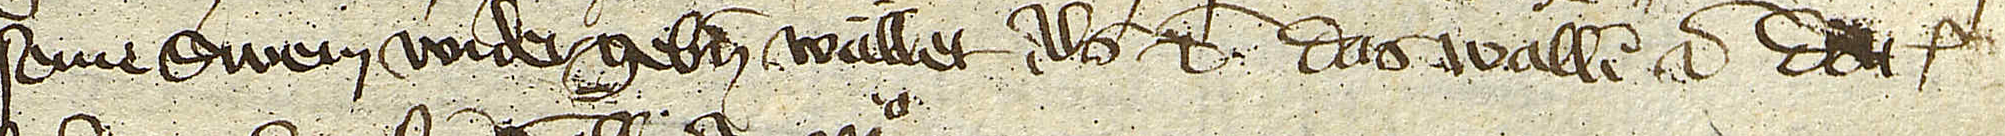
ſeine Swein wider gebn* wöllet Als ec* das wölle* ec* dat*
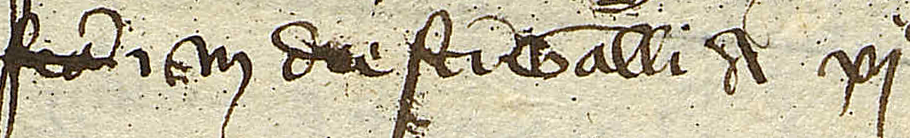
fea* i in die ſci* Gallo A xi*
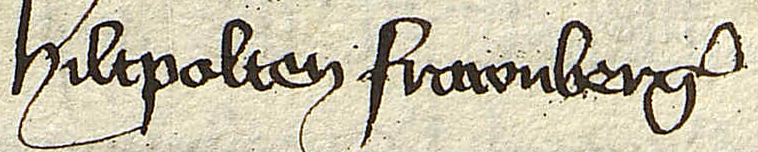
Hilpolten frawnberg*
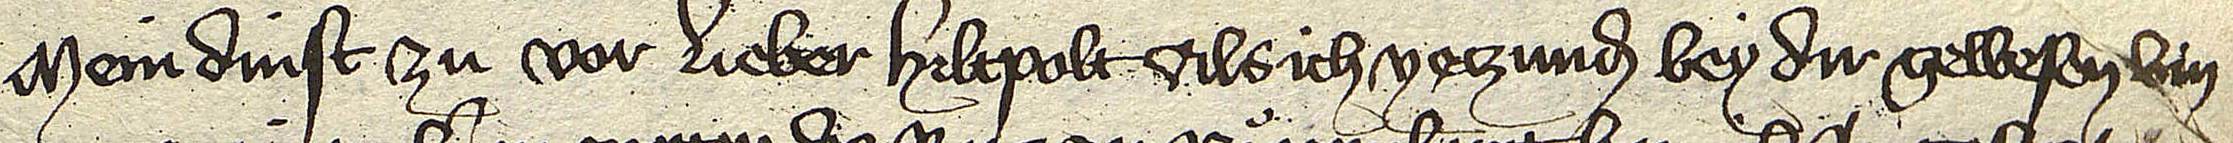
Mein dinſt cʒu vor lieber hilpolt Als ich yecʒund* bey dir geweſen bin
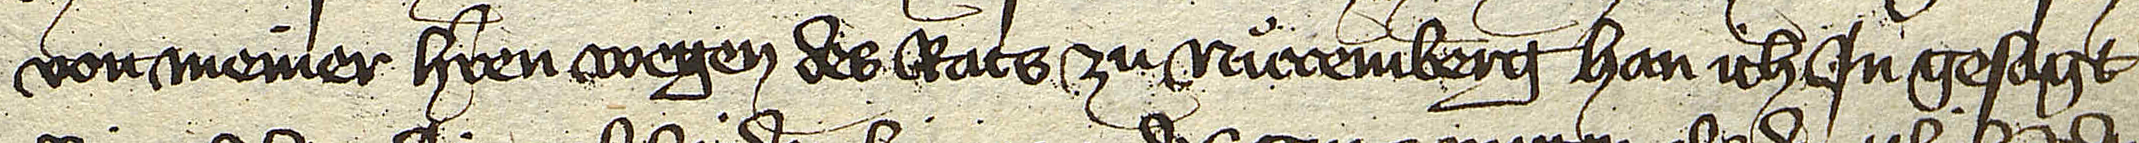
von meiner hr*en wegen des Rats cʒu Nüremberg hab ich In geſagt
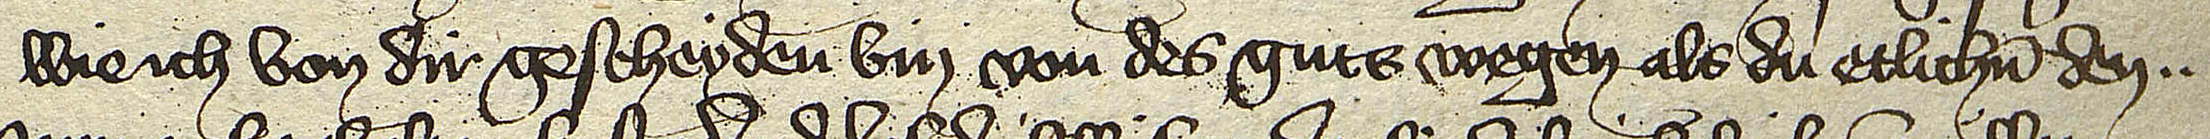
wie ich von dir geſcheyden bin von des guts wegen als du etlichn* den ~
